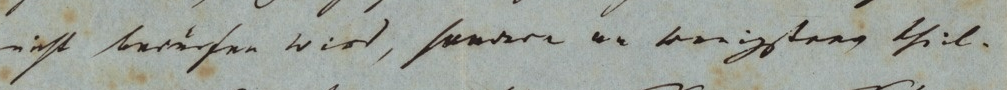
nicht bedürfen wird, sondern an wenigstens theil-
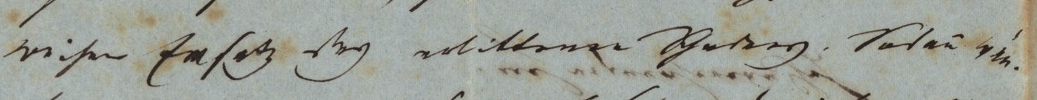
weisen Ersatz des erlittenen Schadens. Sodann wün-
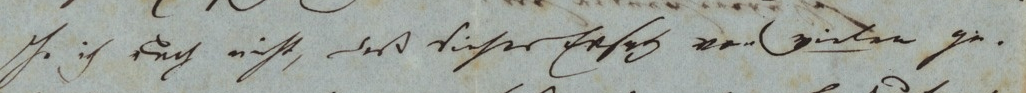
sche ich auch nicht, daß dieser Ersatz von vielen ge-
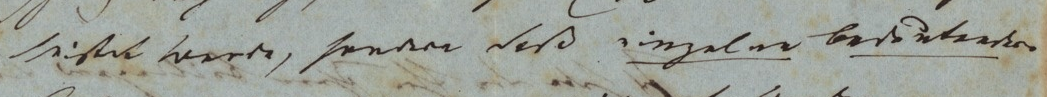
stiftet werde, sondern daß einzelne bedeutendere
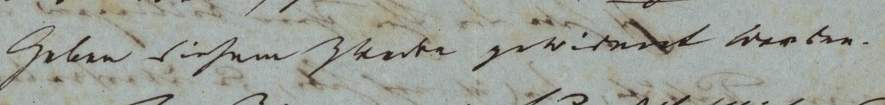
Gaben diesem Zwecke gewidmet werden.
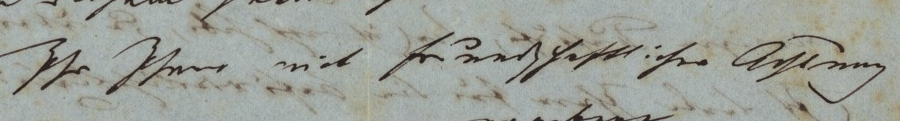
Ihr Ihnen mit Freundschaftlicher Achtung
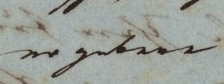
ergebene
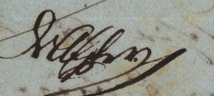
Escher
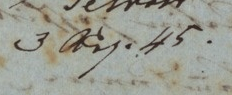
3 Aug. 45
